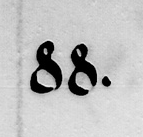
13.
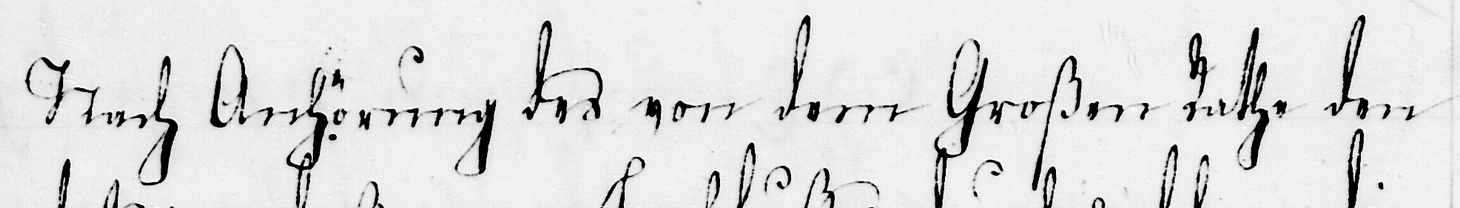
Nach Anhörung des von dem Großen Rathe den
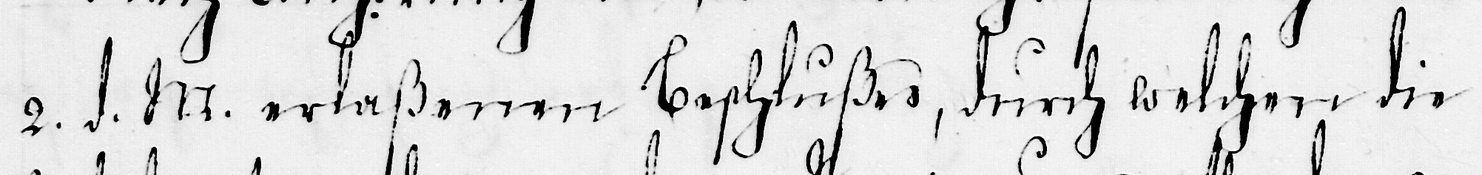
2. d. M. erlaßenen Beschlußes, durch welchen die
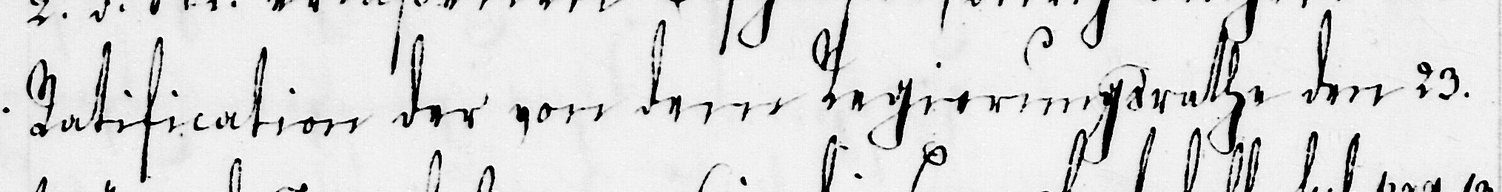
Ratification der von dem Regierungsrathe den 23.
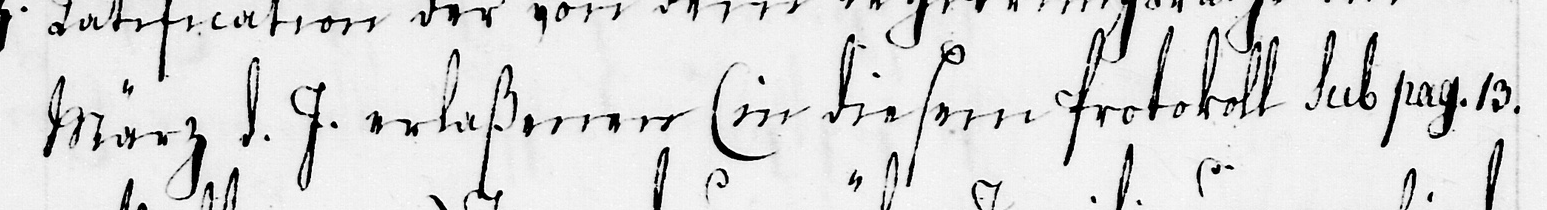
März d. J. erlaßenen (in diesem Protokoll sub pag.
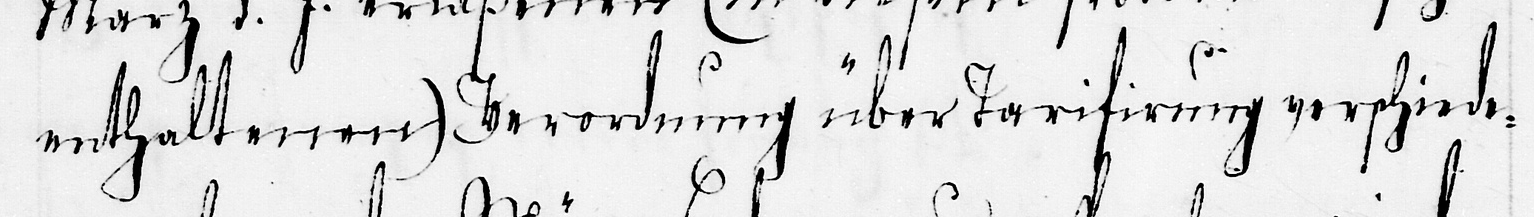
enthaltenen) Verordnung über Tarifirung verschiede¬
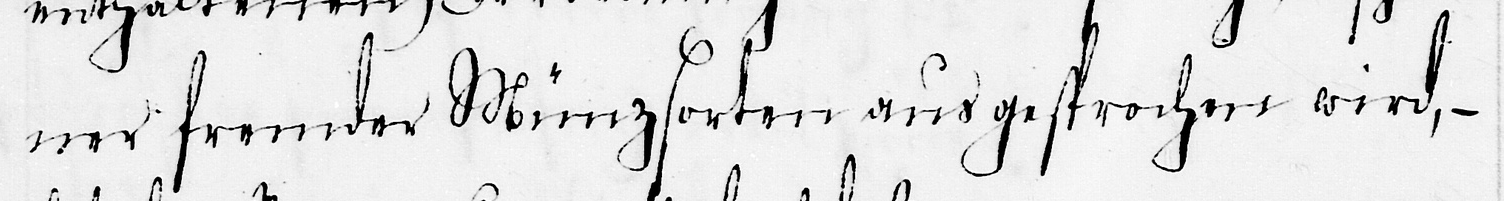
ner fremder Münzsorten ausgesprochen wird, –
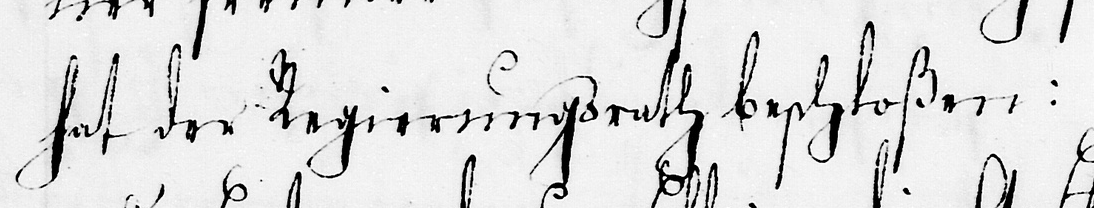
hat der Regierungsrath beschloßen:
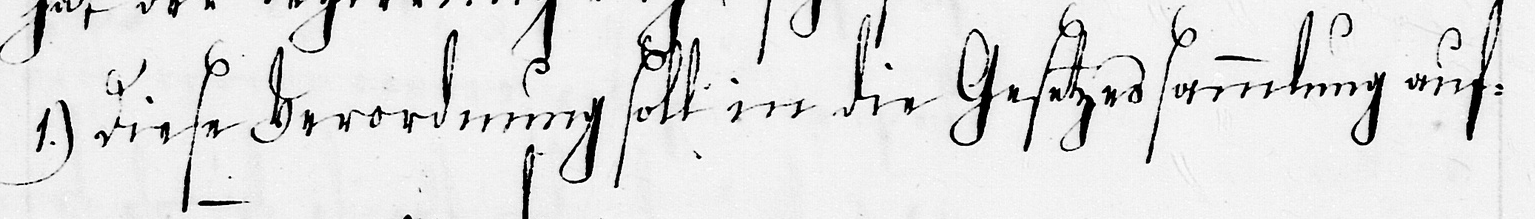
1.) Diese Verordnung soll in die Gesetzessammlung auf¬
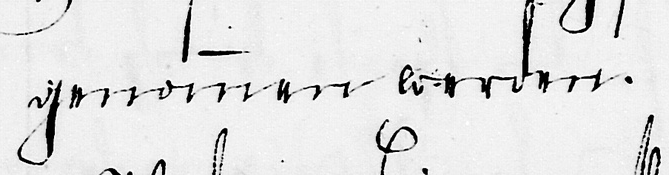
genommen werden.
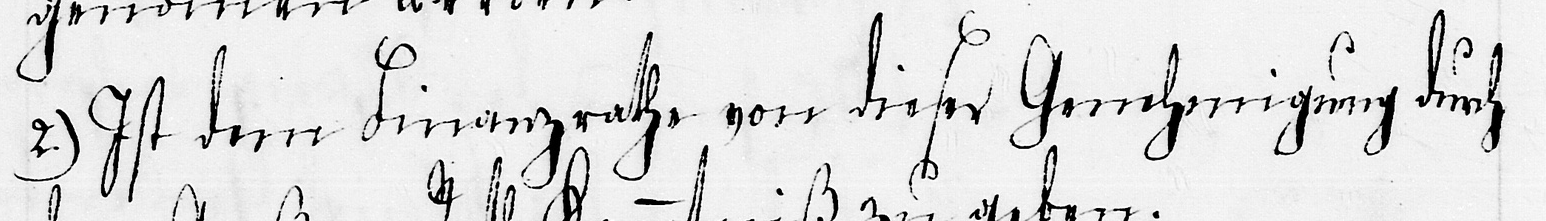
2.) Ist dem Finanzrathe von dieser Genehmigung durch
